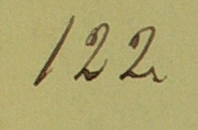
122
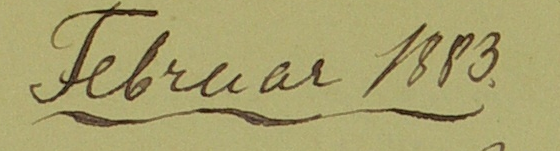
Februar 1883
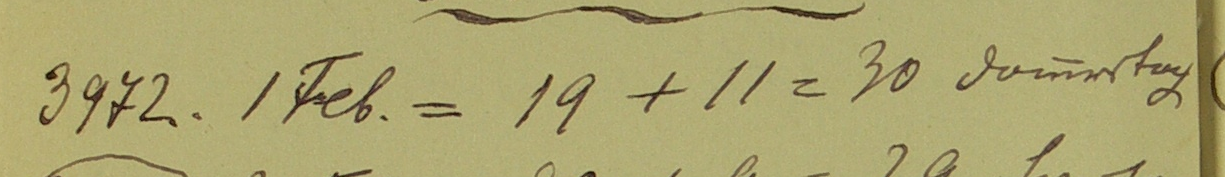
3972. 1. Febr. = 19 + 11 = 30 Donnerstag
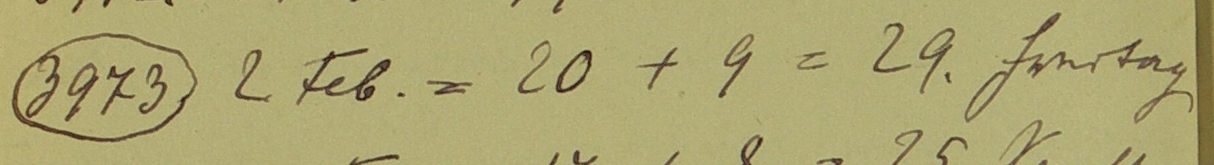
3973. 2. Febr. = 20 + 9 = 29 Freitag
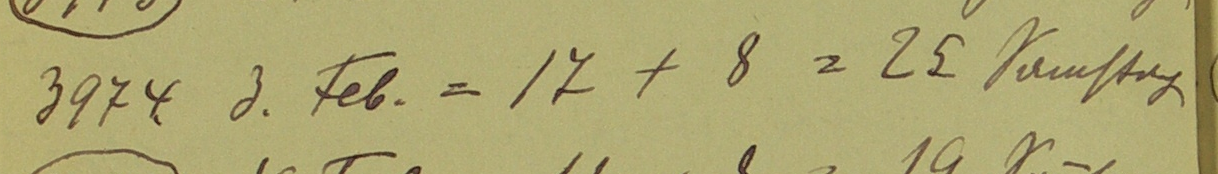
3974. 3. Febr. = 17 + 8 = 25 Samstag
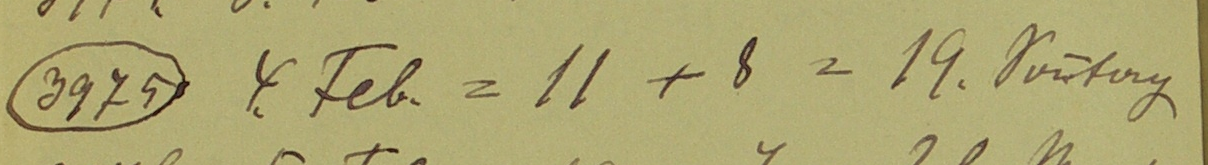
3975. 4. Febr. = 11 + 8 = 19 Sonntag
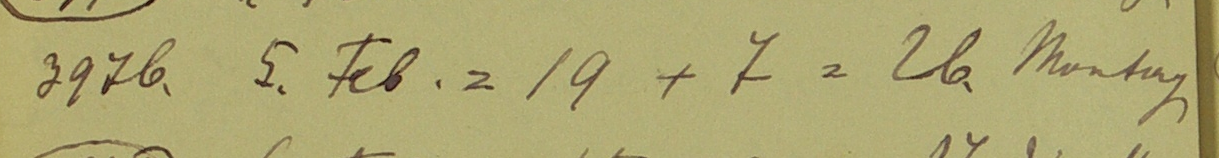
3976. 5. Febr. = 19 + 7 = 26 Montag
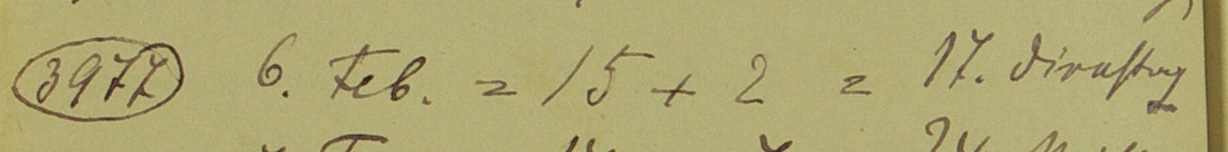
3977. 6. Febr. = 15 + 2 = 17 Dienstag
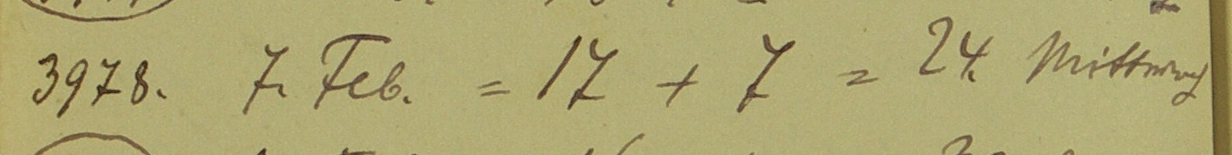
3978. 7. Febr. = 17 + 7 = 24 Mittwoch
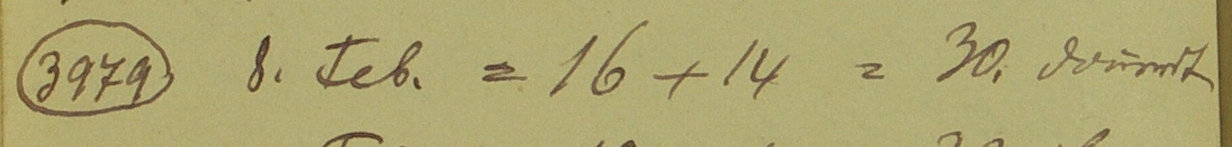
3979. 8. Febr. = 16 + 14 = 30 Donnerstag
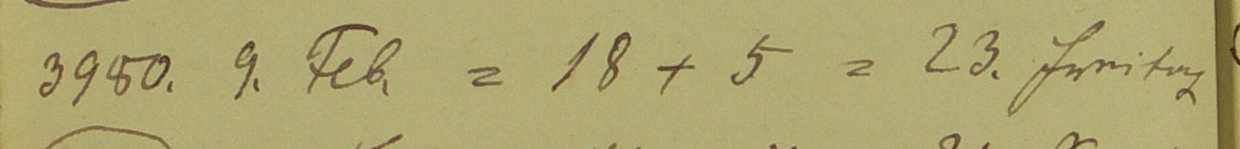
3980. 9. Febr. = 18 + 5 = 23 Freitag
